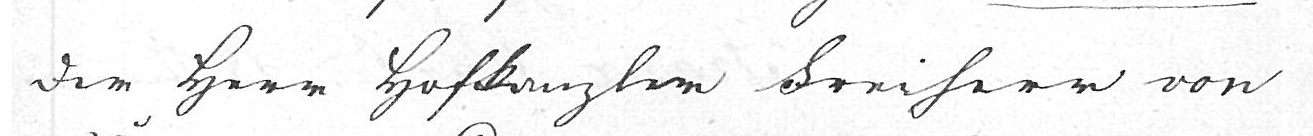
der Herr Hofkanzler Freiherr von
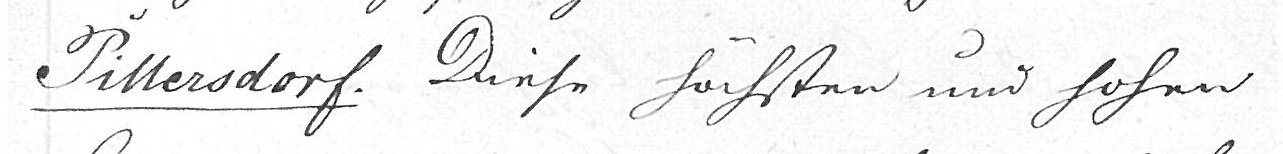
Pillersdorf. Diese höchsten und hohen
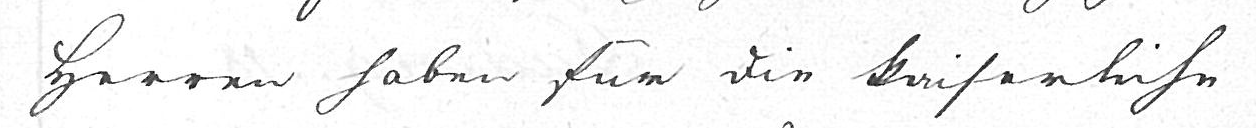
Herren haben für die kaiserliche
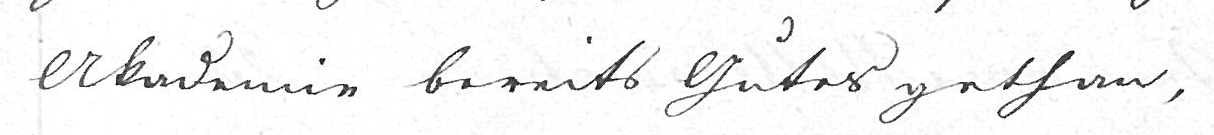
Akademie bereits Gutes gethan,
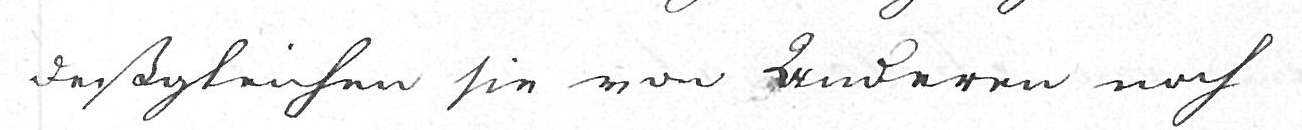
deßgleichen sie von Anderen ncoh
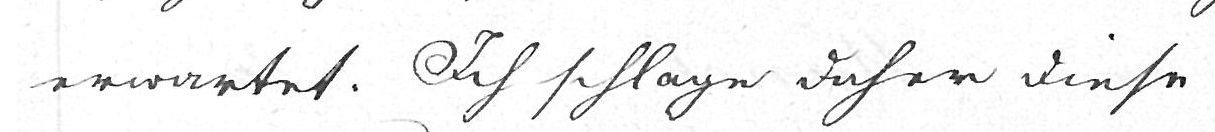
erwartet. Ich schlage daher diese
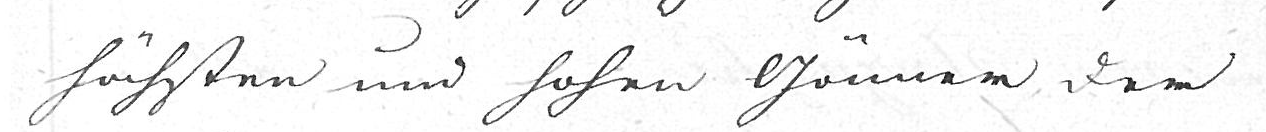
höchsten und hohen Gönner der
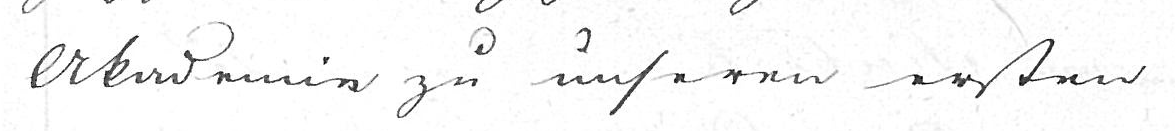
Akademie zu unseren ersten
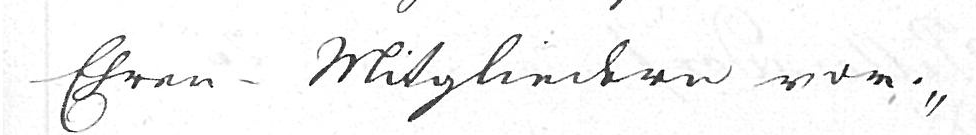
Ehren-Mitgliedern vor."
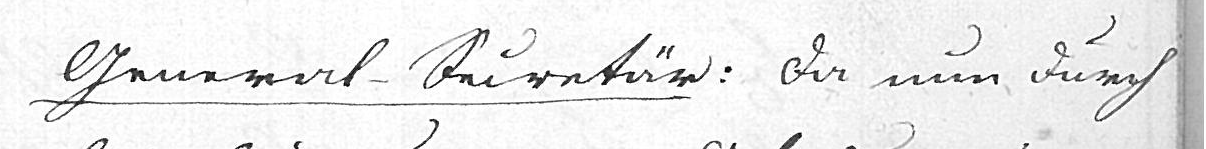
General-Secretär: Da nun durch
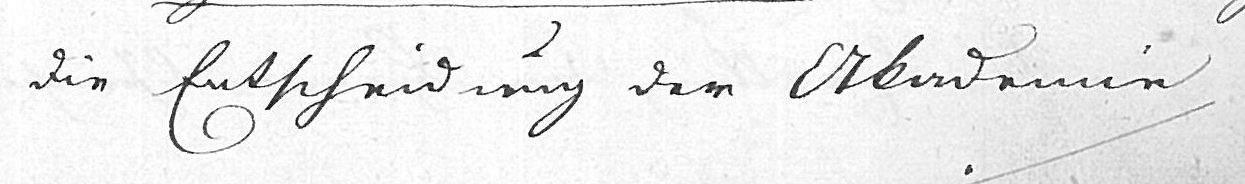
die Entscheidung der Akademie
